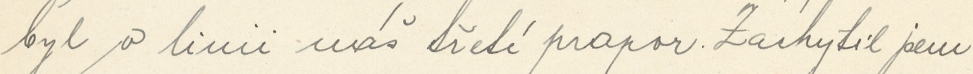byl v linii náš třetí prapor. Zachytil jsem
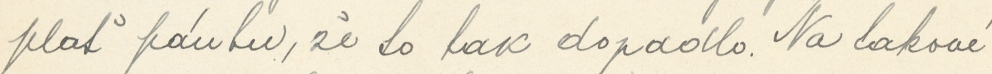plať pánbu, že to tak dopadlo. Na takové
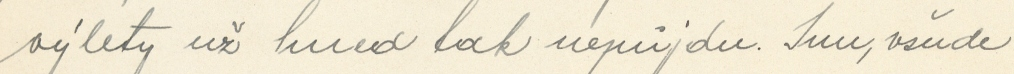výlety už hned tak nepůjdu. Inu, všude
